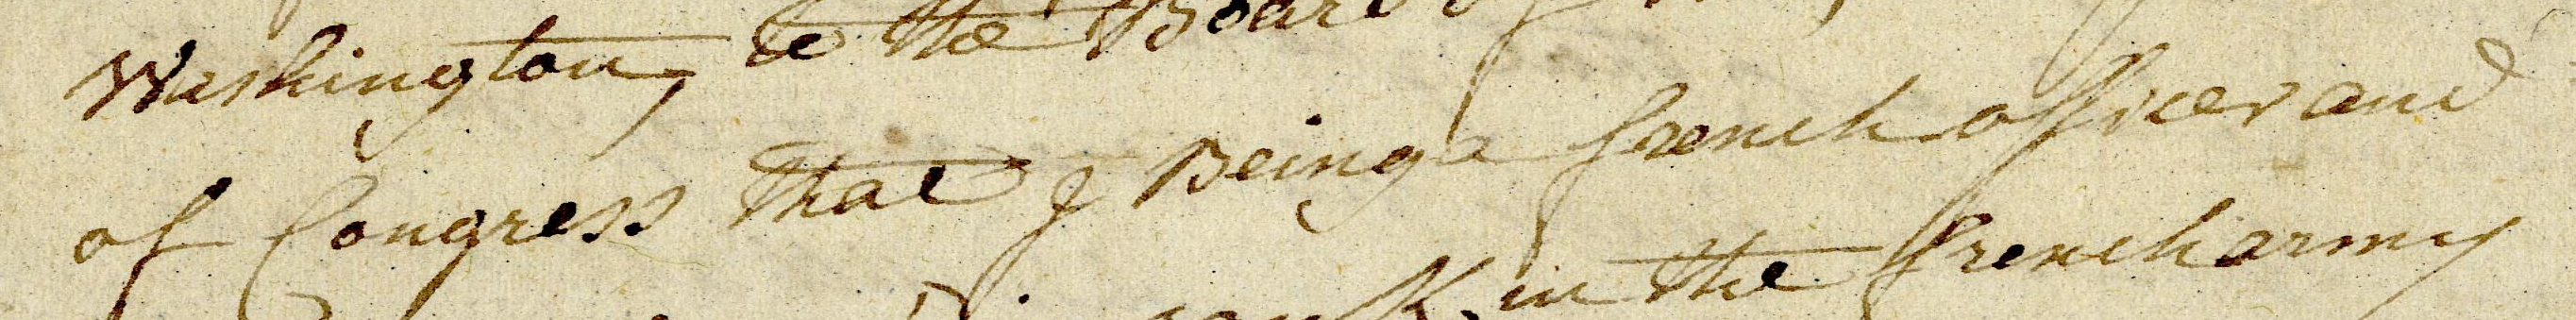of Congress that I Being a french officer and
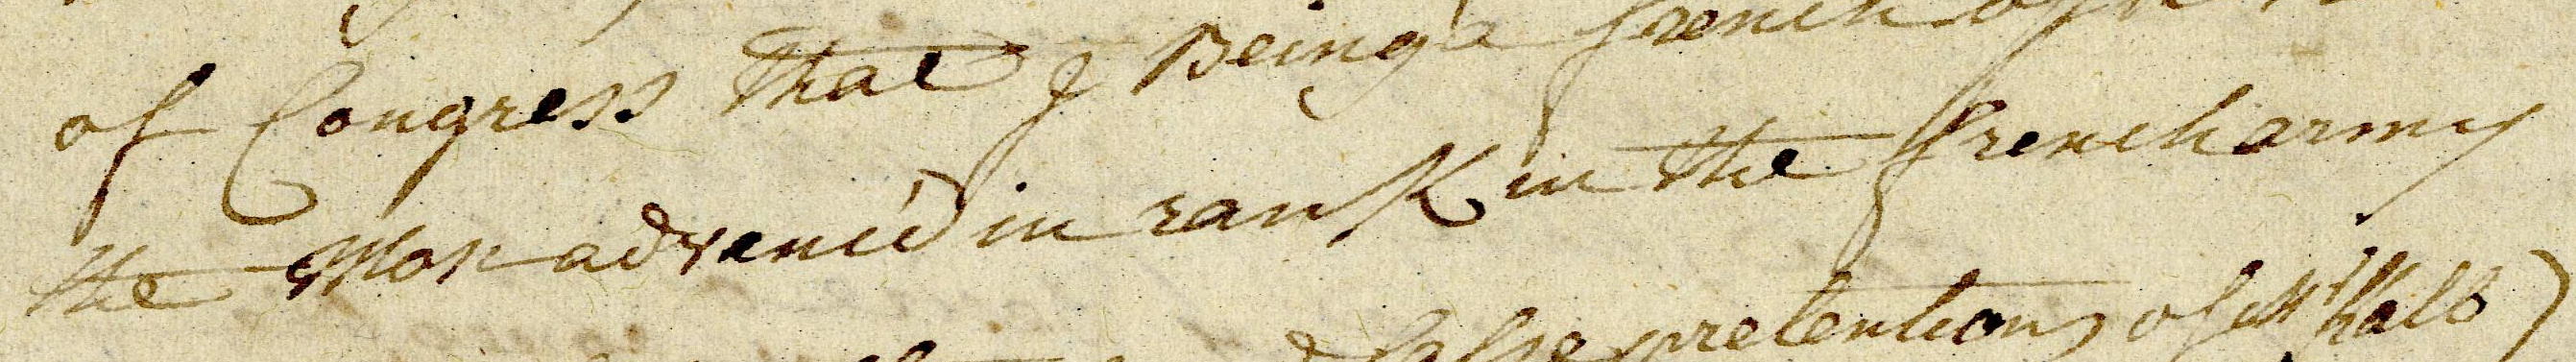the Most advanc'd in rank in the French army
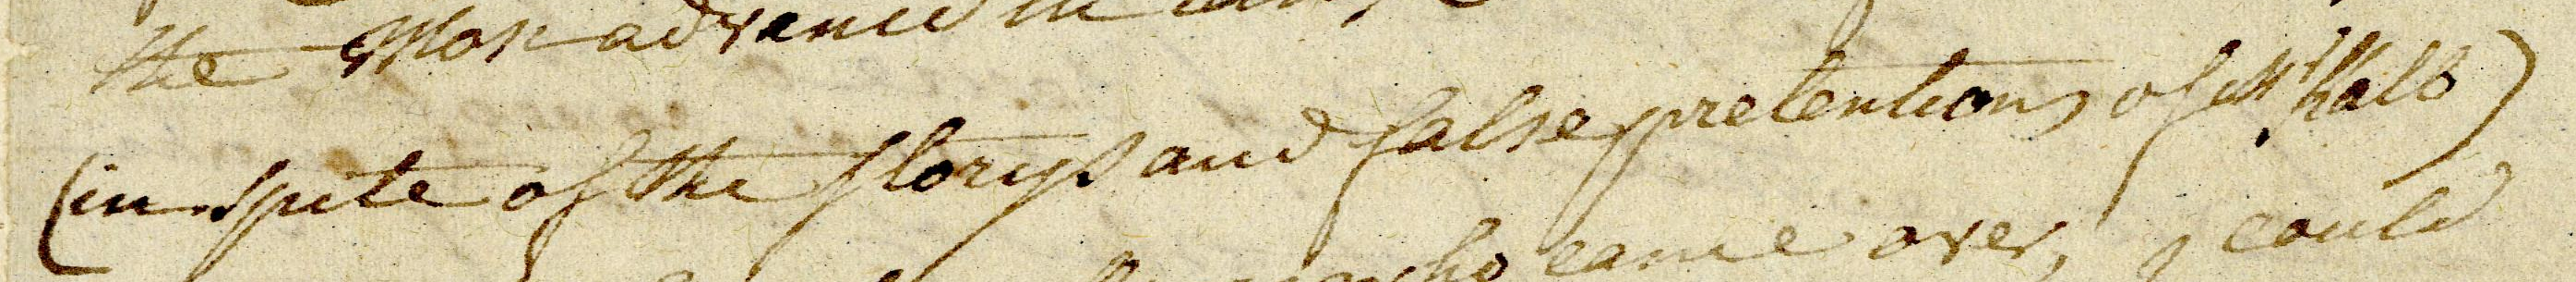(in spite of the storys and false pretentions of d'Kalb)
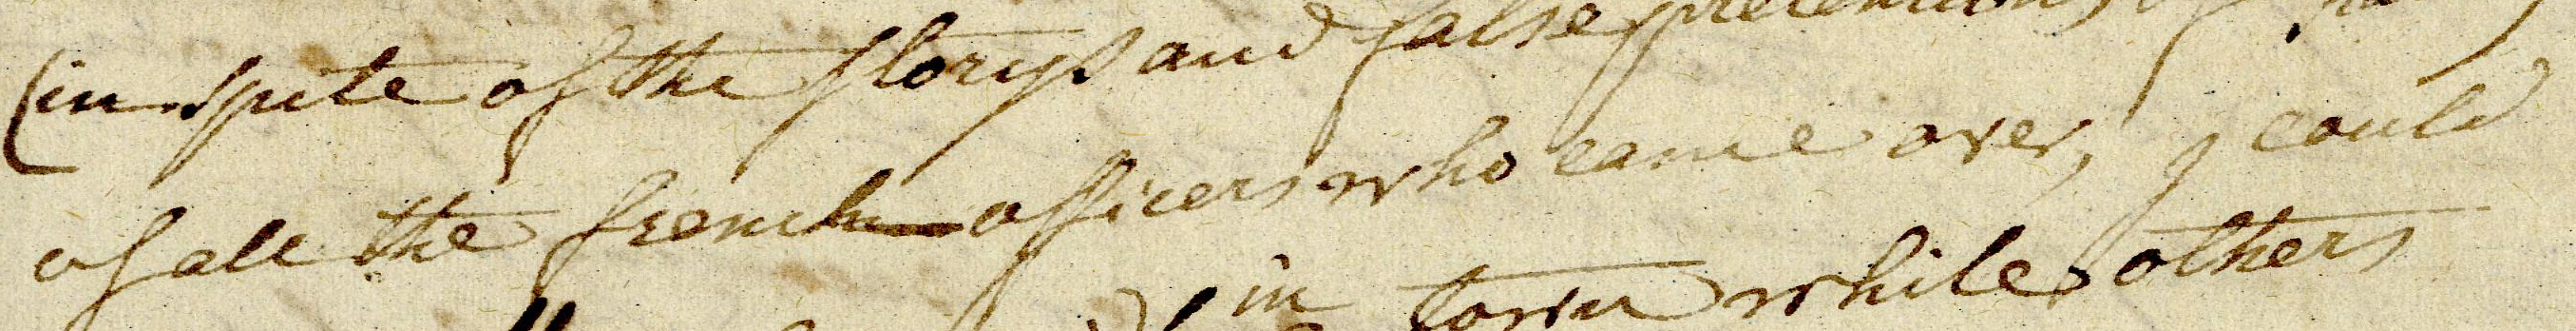of all the french officers who came over, I could
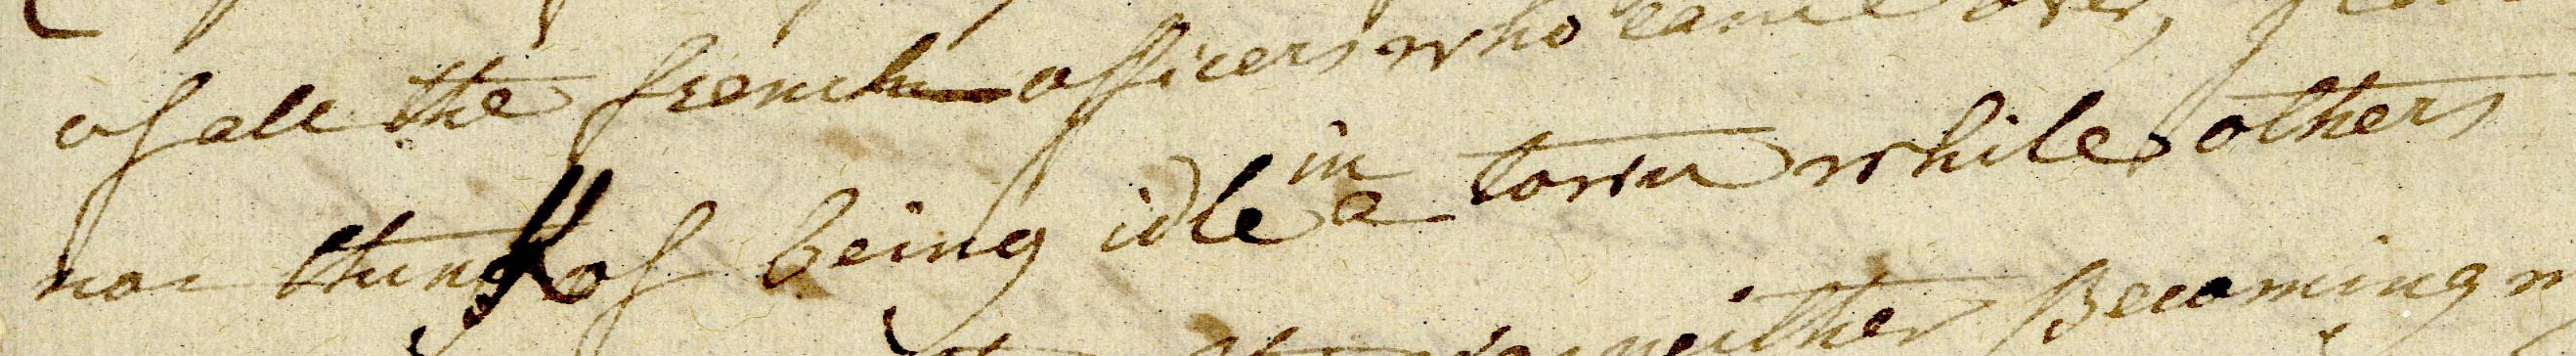not think of being idle in a town while others
